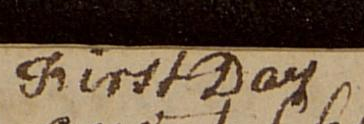First Day
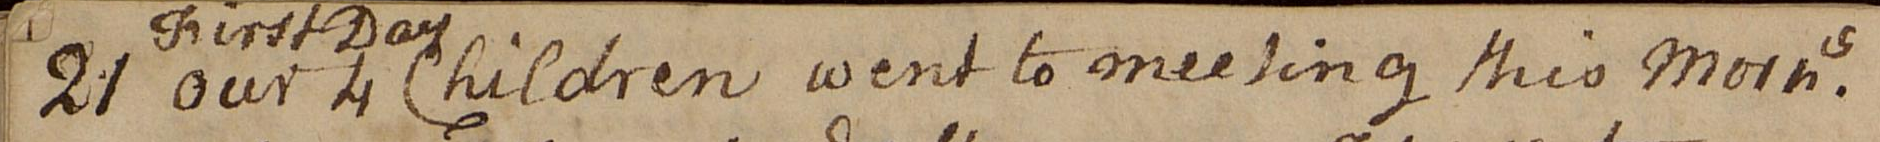21 our 4 Children went to meeting this Mor^g.
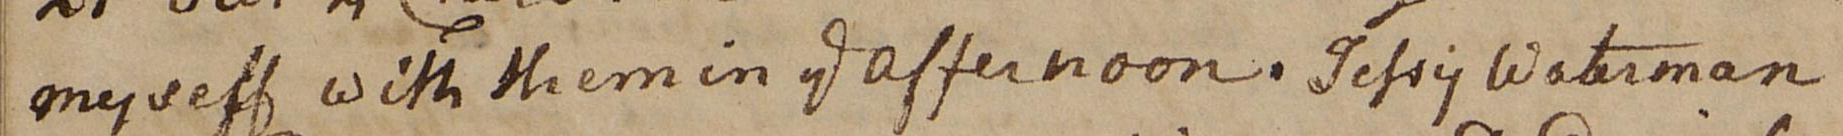myseff with them in y^e afternoon. Jessy Waterman
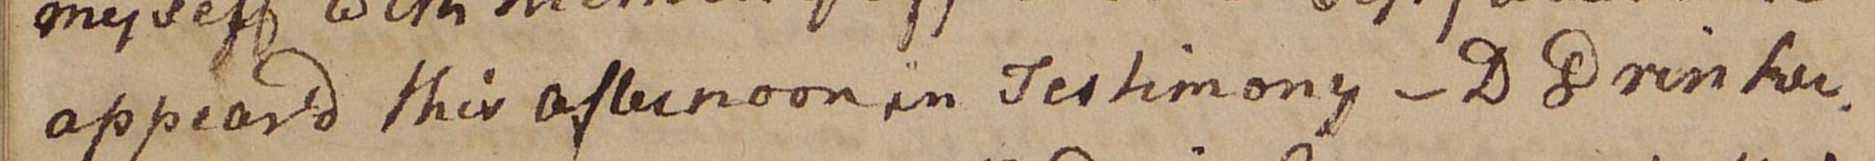appear'd this afternoon in Testimony- D Drinker
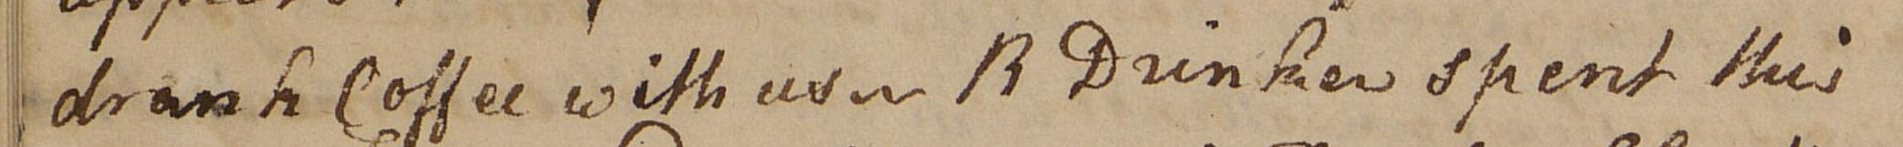drank Coffee with us- R Drinker spent this
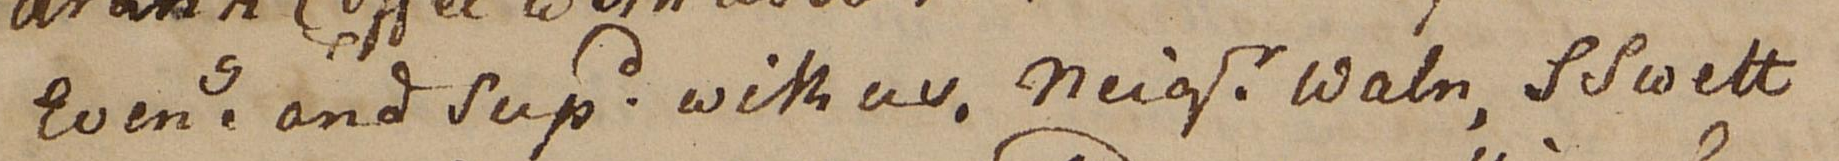Even^g. and sup^d. with as, Neigh^r. Waln, S Swett
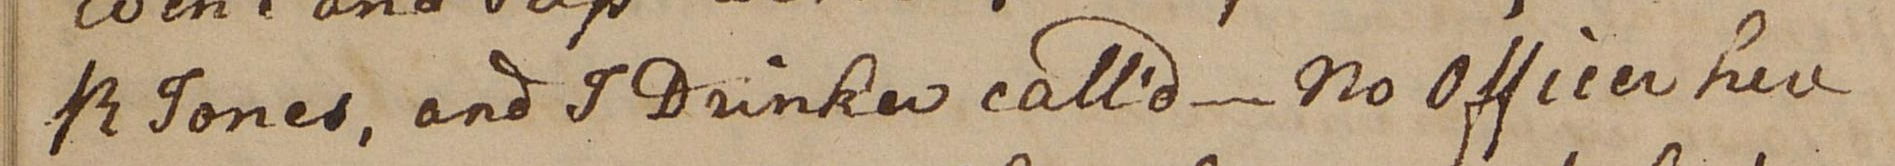R Jones, and I Drinker call'd- No Officer here
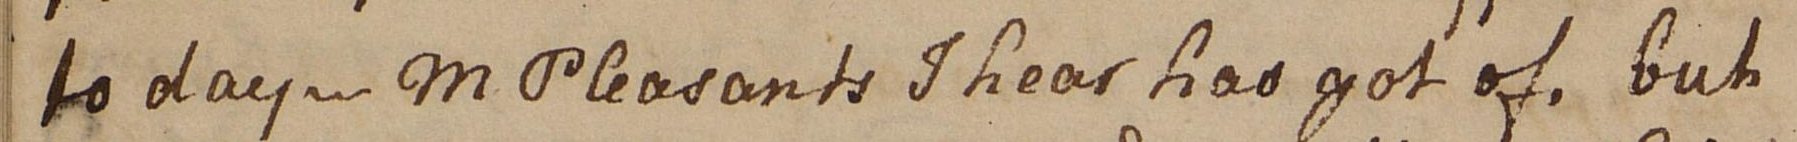to day- M Pleasants I hear has got of, but
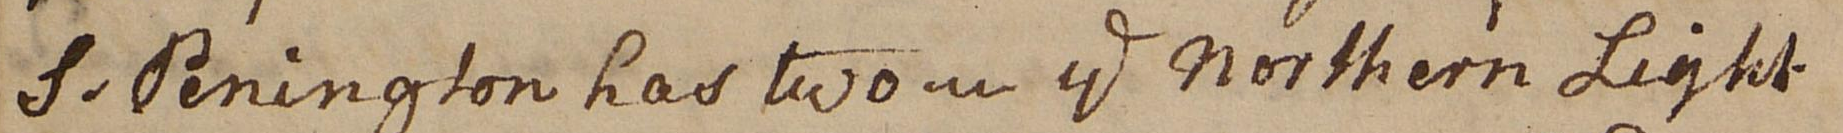S. Penington has two - y^e Northern Light
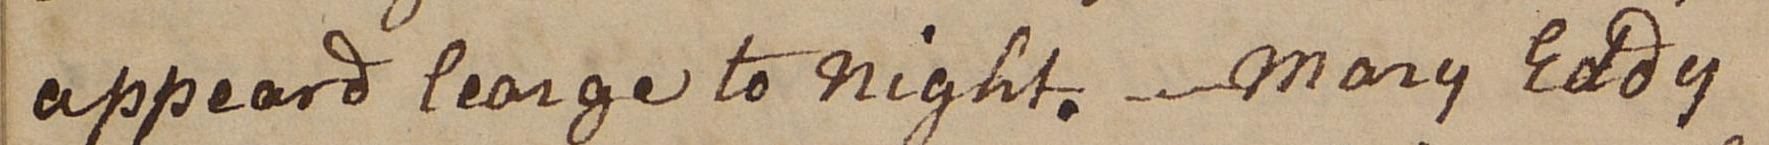appeard learge to Night.- Mary Eddy
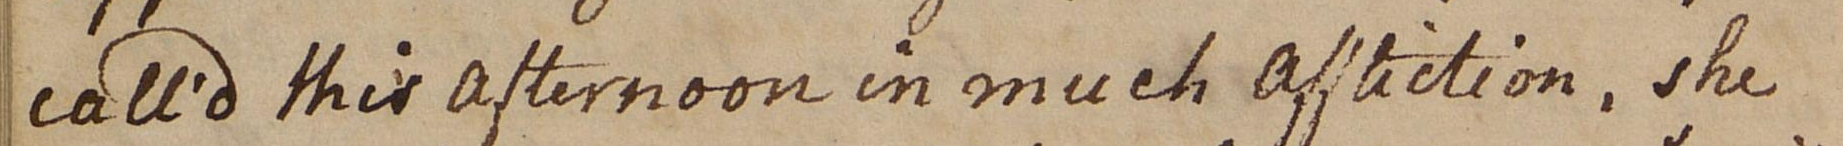call'd this Afternoon in much Afftection, she
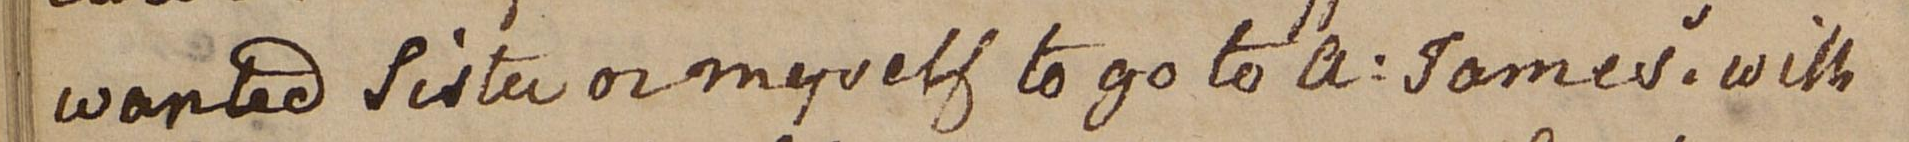wanted Sister or myself to go to A: James^s. with
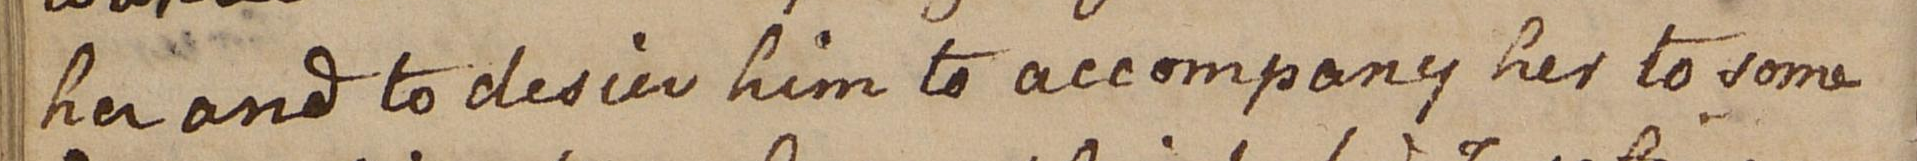her and to desire him to accompany her to some
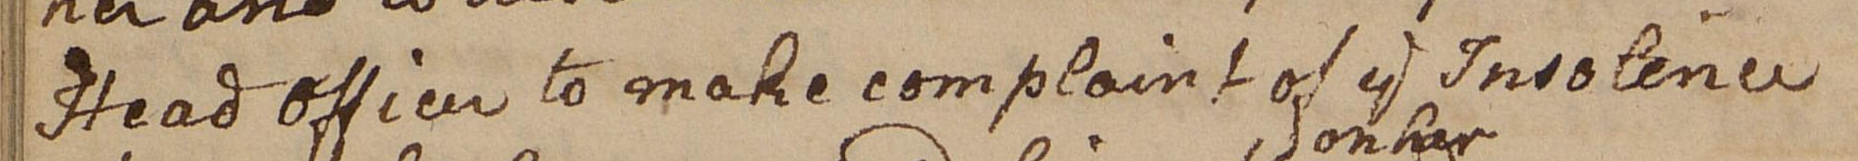Head Officer to make complaint of y^e Insolence
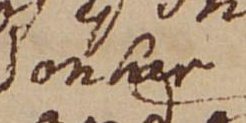on her
